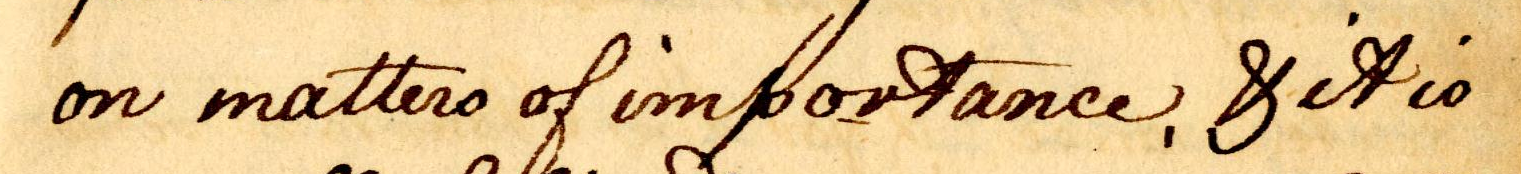on matters of importance, & it is
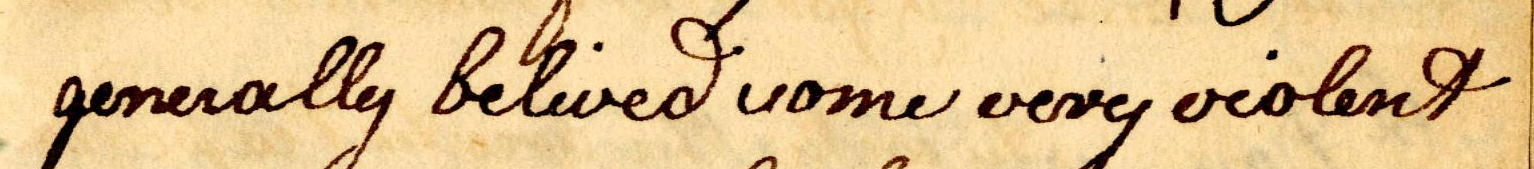generally belived some very violent
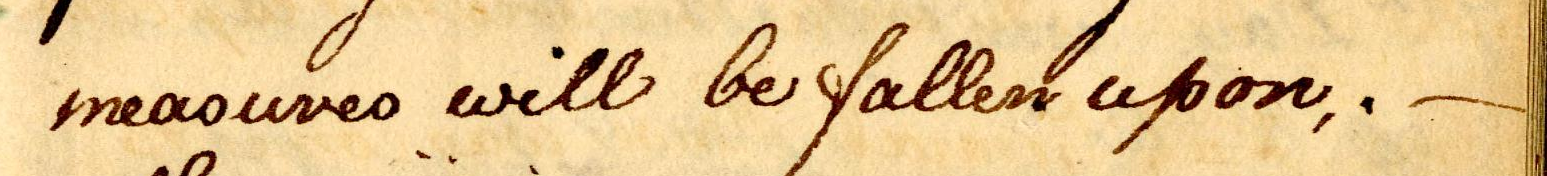measures will be fallen upon,.-
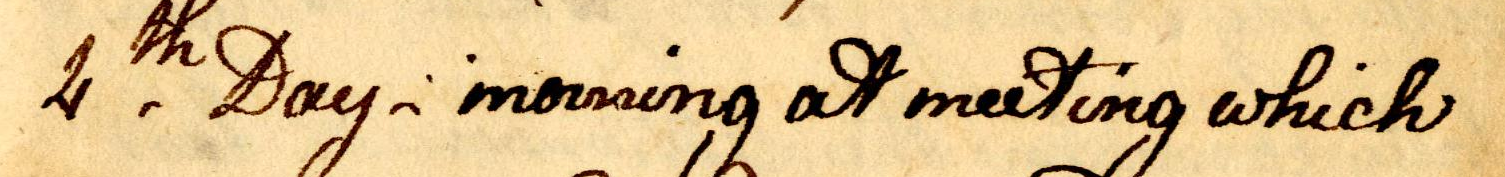4^th. Day- morning at meeting which
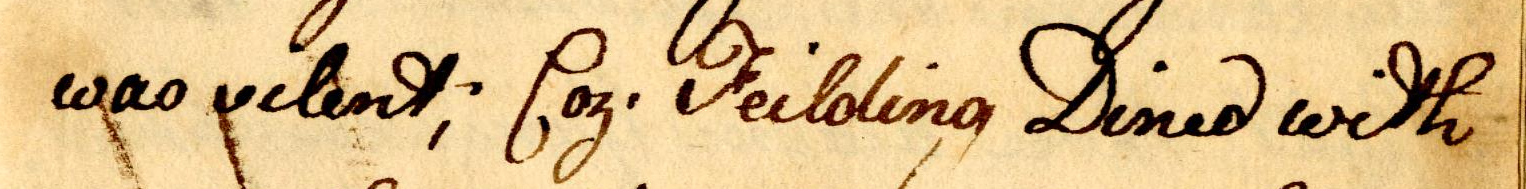was silent; Coz. Feilding Dined with
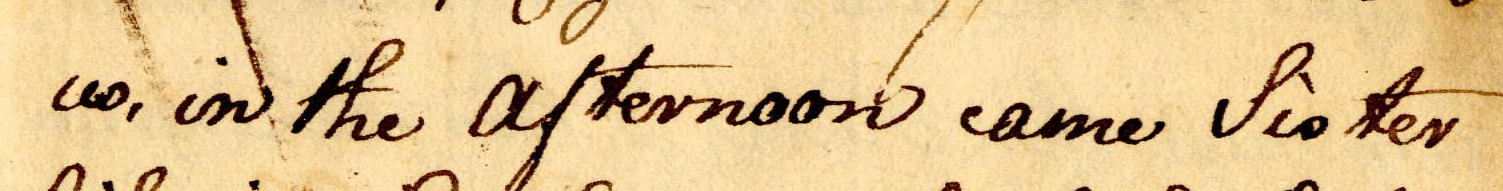us, in the Afternoon came Sister
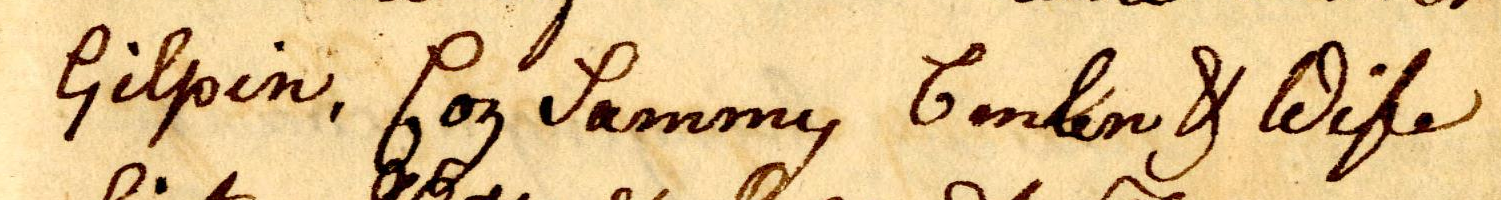Gilpin, Coz Sammy Emlen & Wife
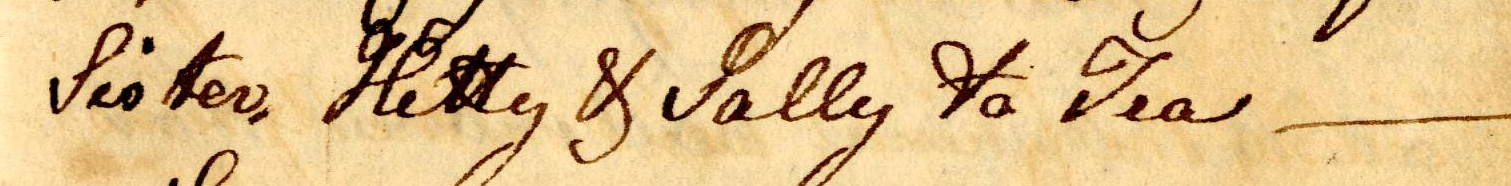Sister, Hetty & Sally to Tea-
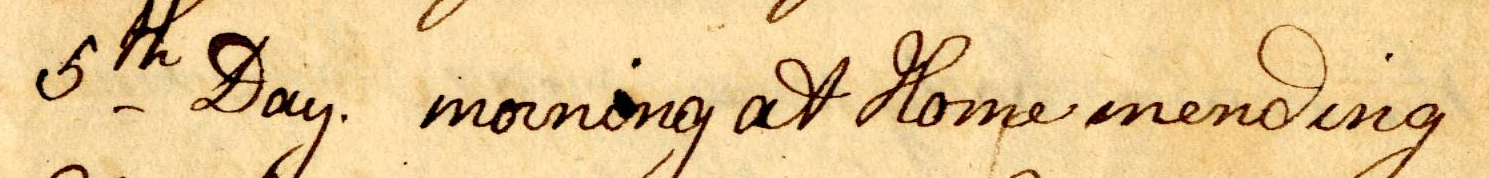5^th Day. morning at Home mending
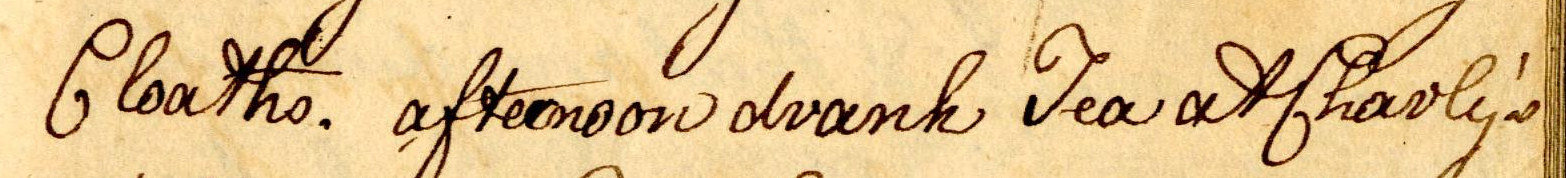Cloaths. afternoon drank Tea at Charly's
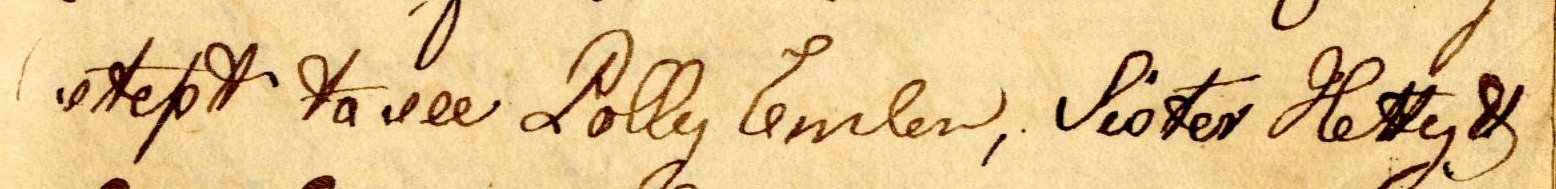stept to see Polly Emlen, Sister Hetty &
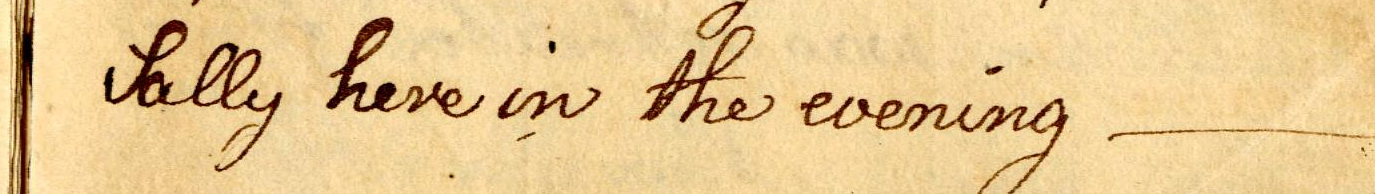Sally here in the evening-
